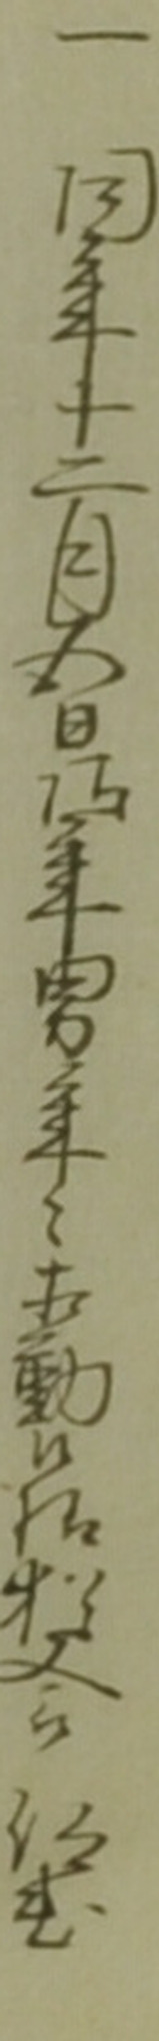一同年十二月五日御年男年々相勤候様猶又被仰出
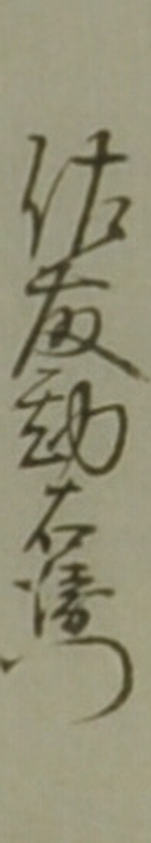佐藤勘右衛門
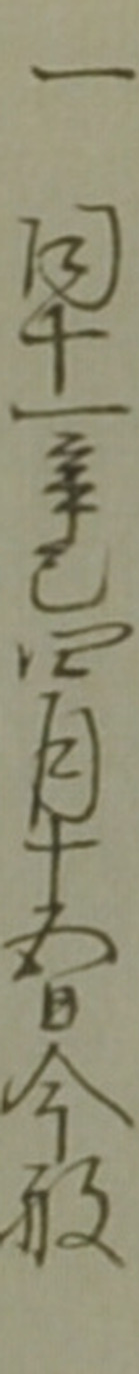一同十一辛巳四月十五日今般

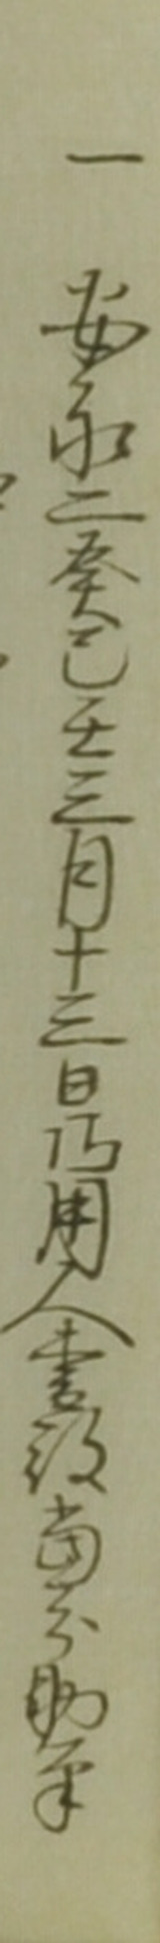一安永二癸巳閏三月十三日御用人書役当分助筆
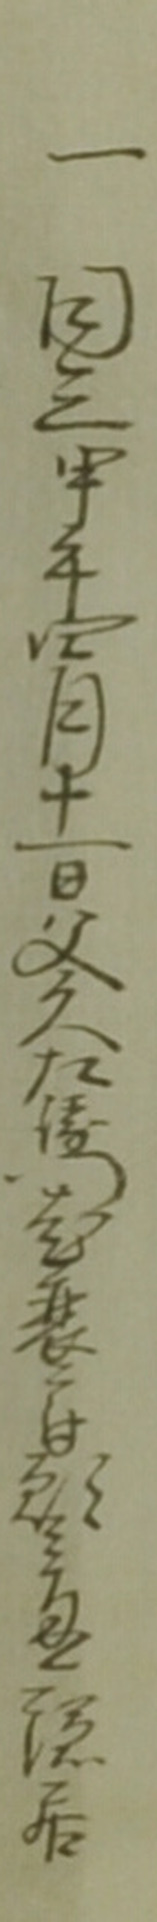一同三甲午四月十一日父久左衛門老衰ニ付願之通隠居

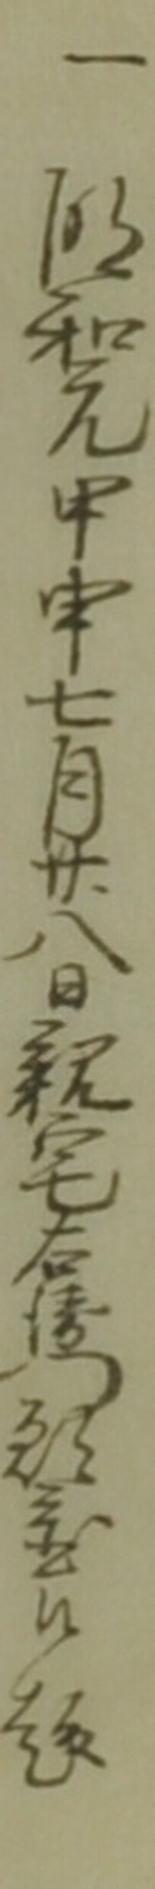一明和元甲申七月廿八日親宅右衛門願置候趣
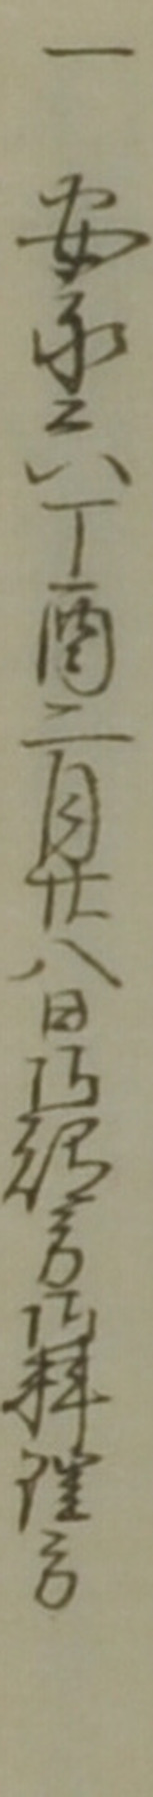一安永六丁酉二月廿八日御賄方御料理方
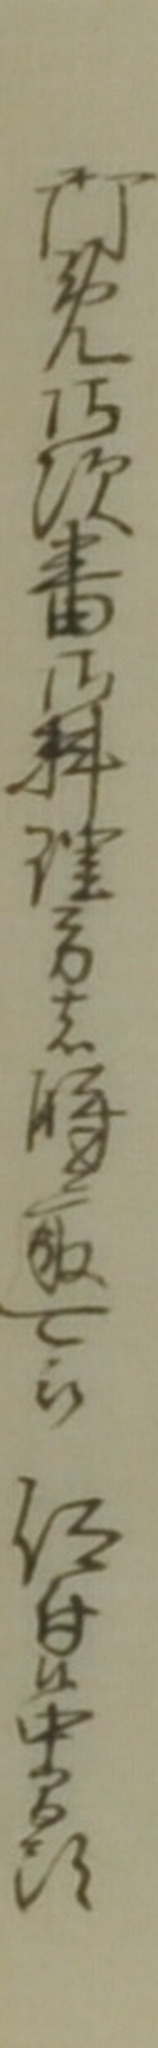御免御次番御料理方者時取可被仰付中間頭
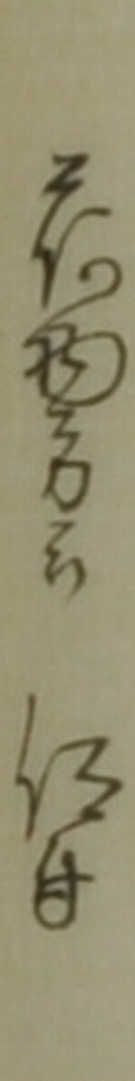荷物方被仰付
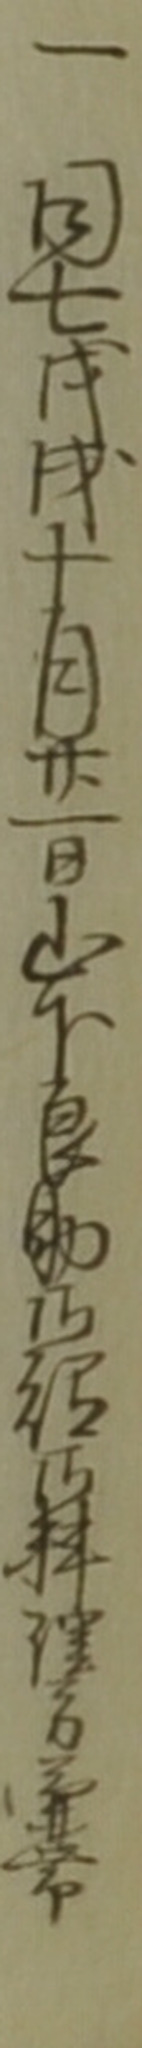一同七戊戌十月廿一日山下良助御賄御料理方兼帯
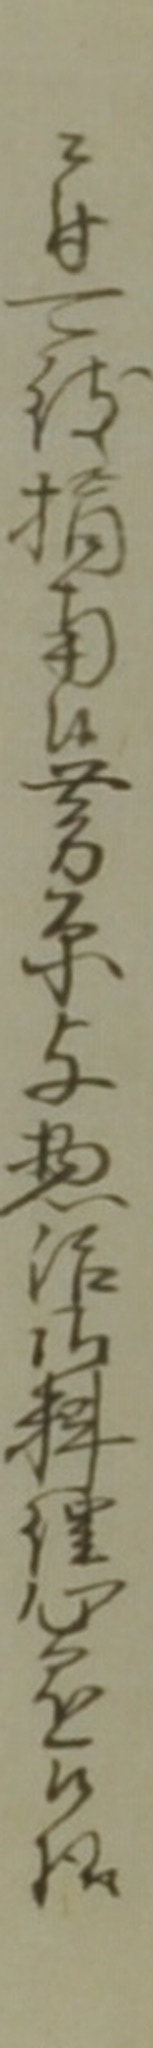ニ付可致指南候芳原与惣治御料理心懸候様
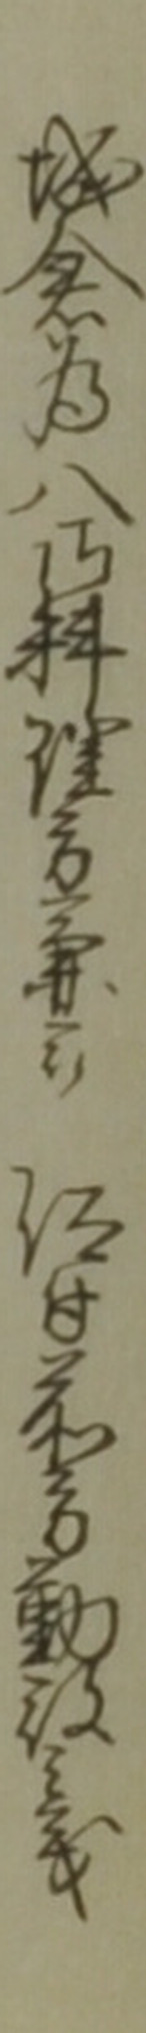城倉為八御料理方兼被仰付前方勤役之義
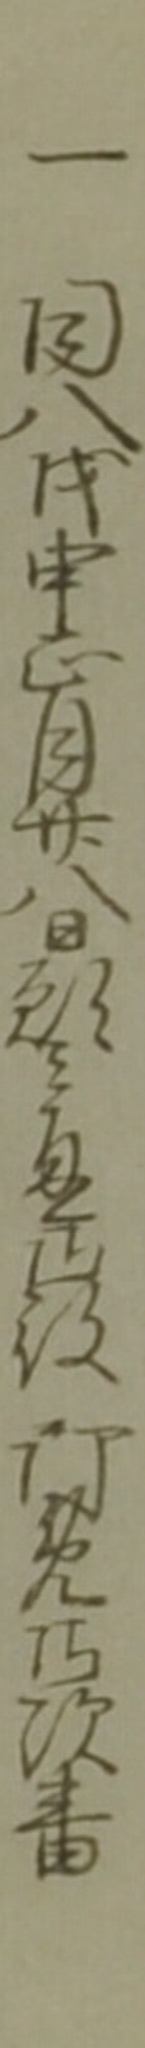一同八戊申正月廿八日願之通御役御免御次番
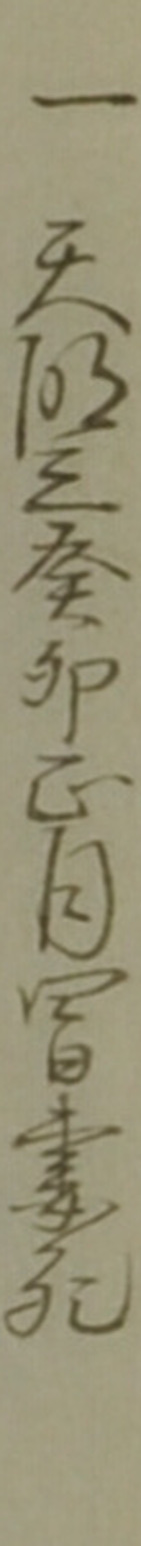一天明三癸卯正月四日妻死
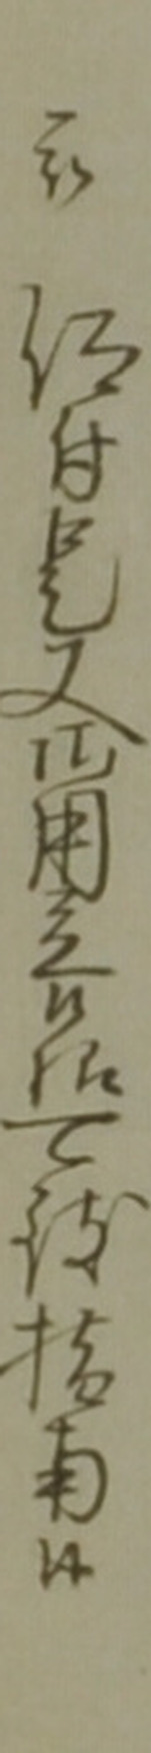被仰付是又御用立候様可致指南候
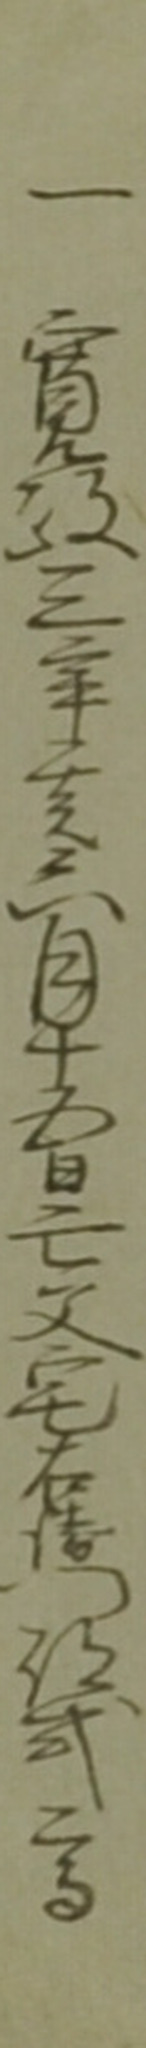一寛政三辛亥六月十五日亡父宅右衛門跡式高
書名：無足廃家（弐）
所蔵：伊那市立高遠町図書館・合同会社AMANE
